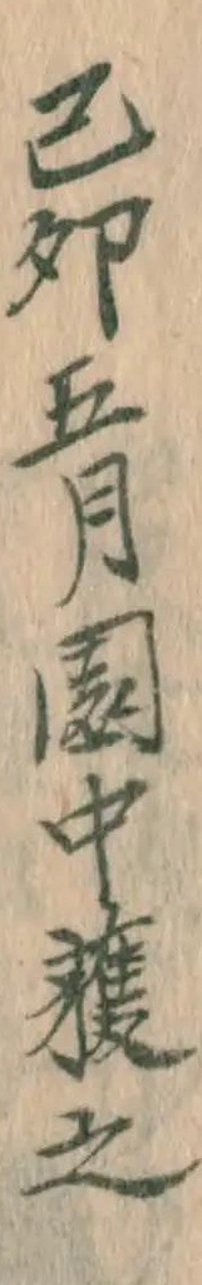己卯五月園中獲之
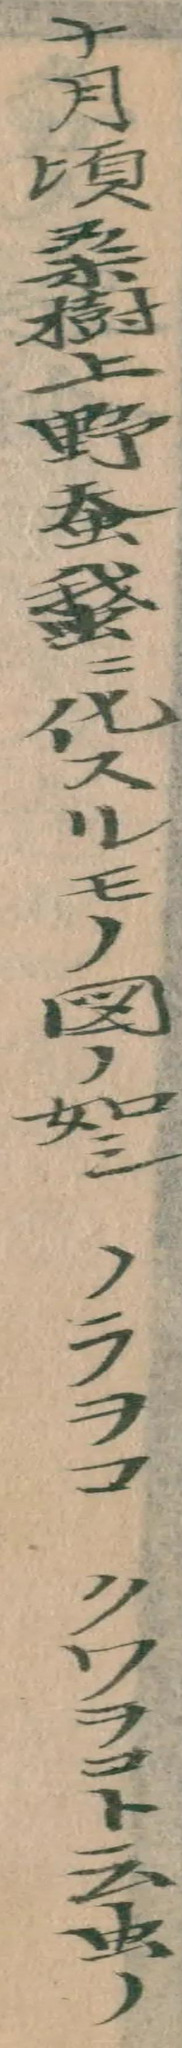十月頃桑樹上野蚕䖸ニ化スルモノ図ノ如シノラヲコクワヲコト云虫ノ
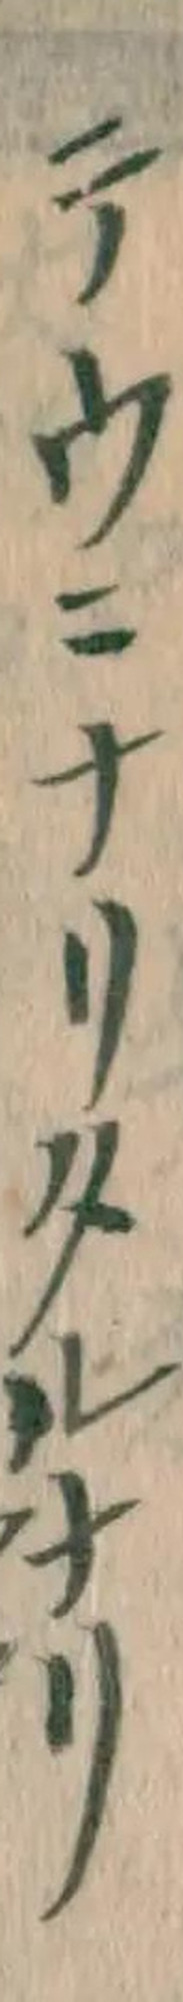テウニナリタルナリ
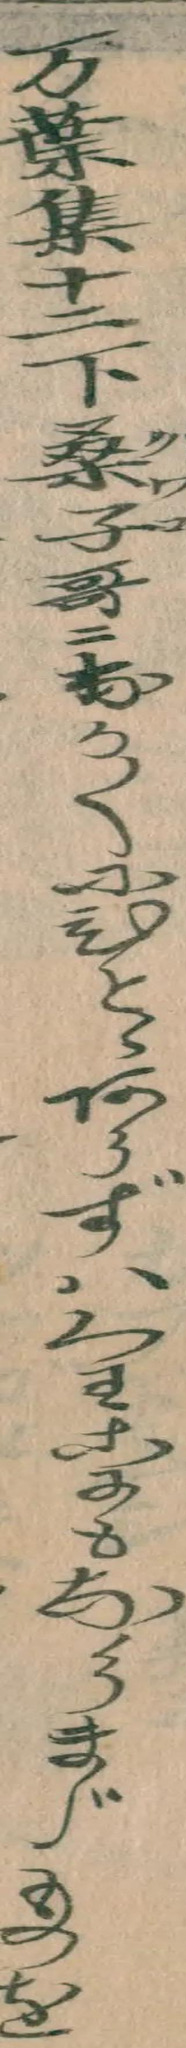万葉集十二下桑子哥になか〳〵にひとゝあらずはくわこにもならまじものを
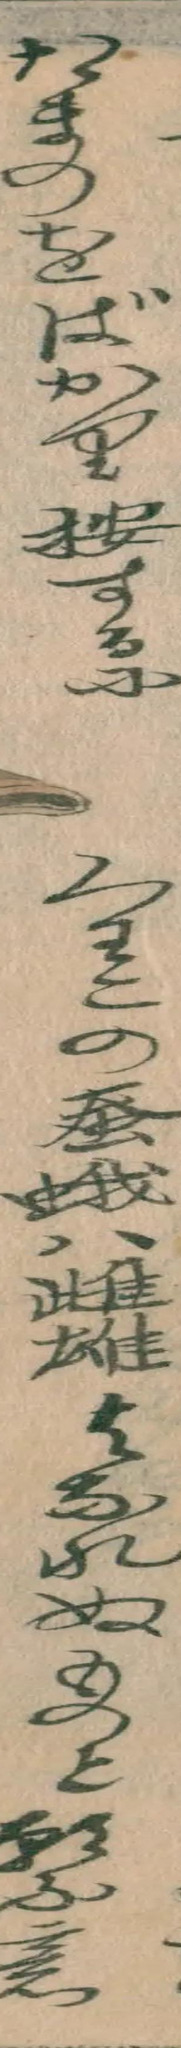たまのをばかり按するにくわこの蚕蛾は雌雄はなれぬものと願ふ意
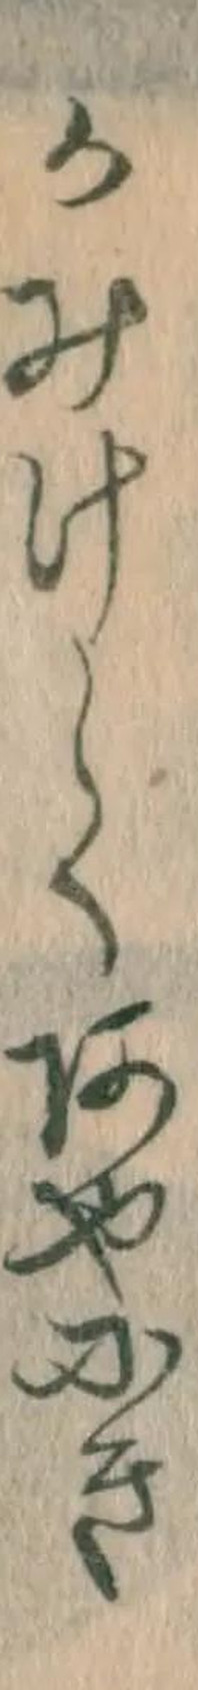かみけしゝあやにき
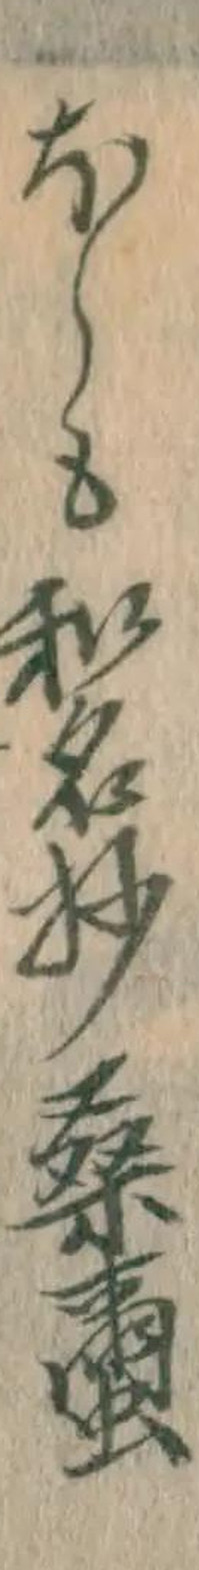ほしも和名抄桑蠒
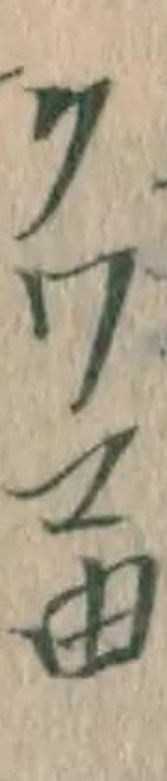クワマ由

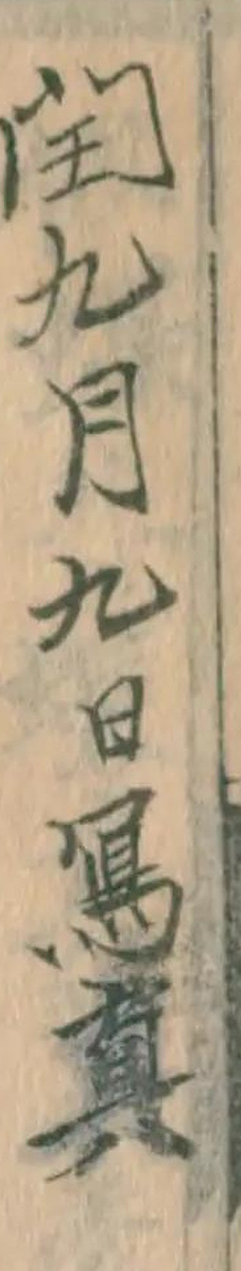閏九月九日冩真
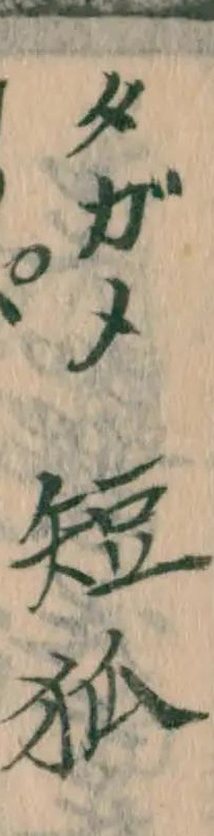タガメ短狐
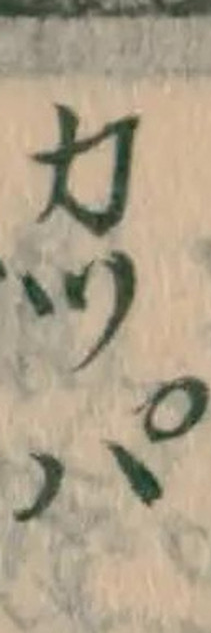カツパ
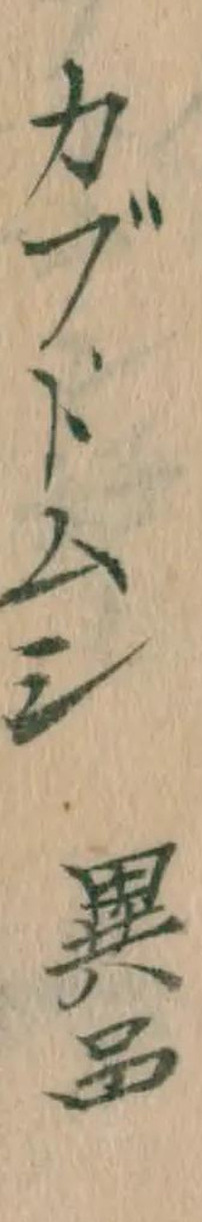カブトムシ異品
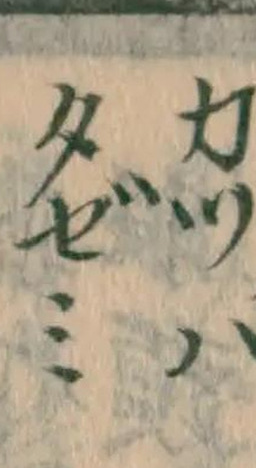タゼミ
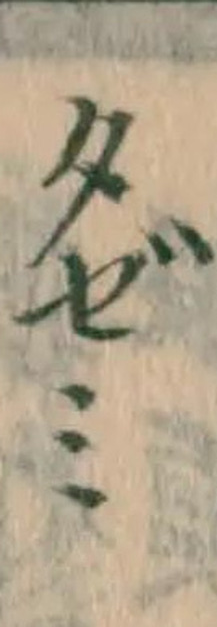タゼミ
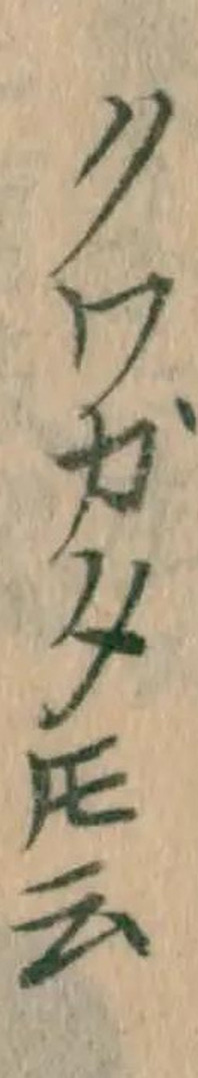クワガタトモ云
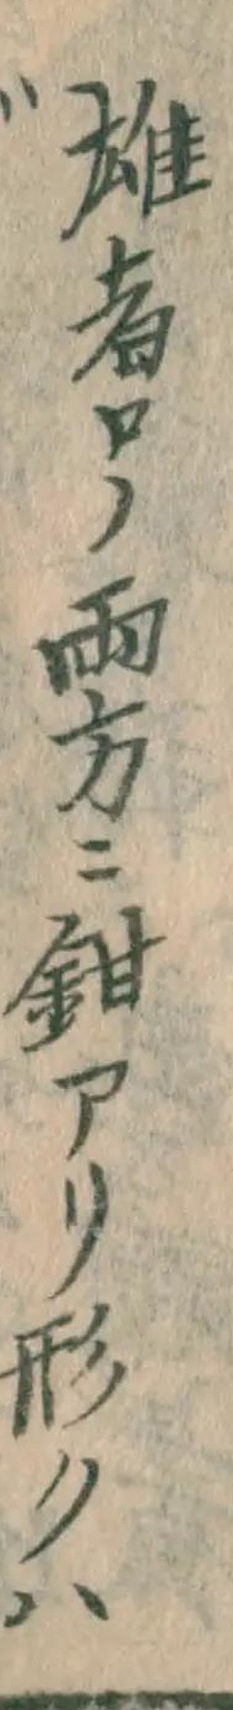雄者口ノ両方ニ鉗アリ形クハ
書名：千蟲譜 3巻. [1]
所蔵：国立国会図書館 National Diet Library, JAPAN
